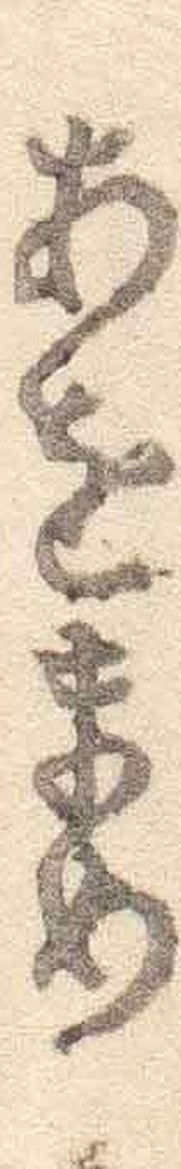あをまめ
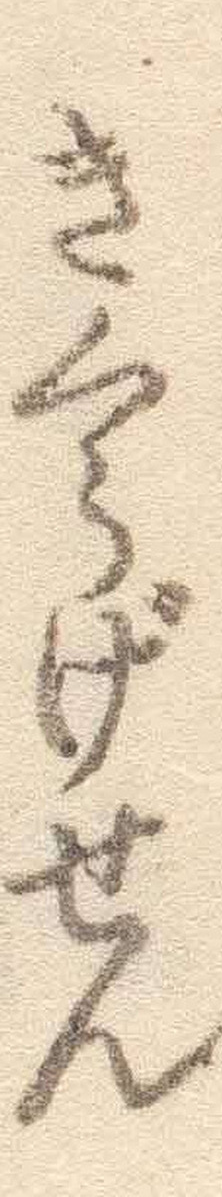きくらげせん
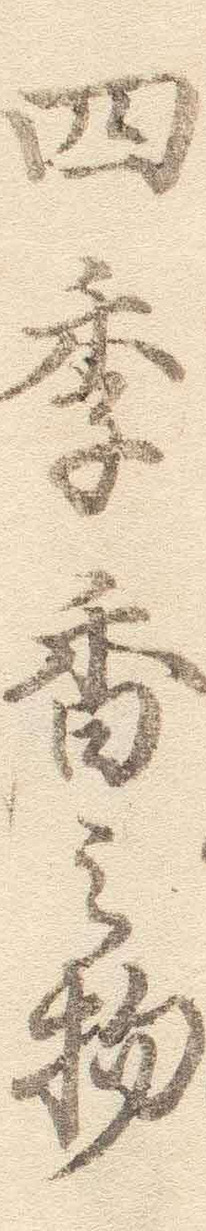四季香之物
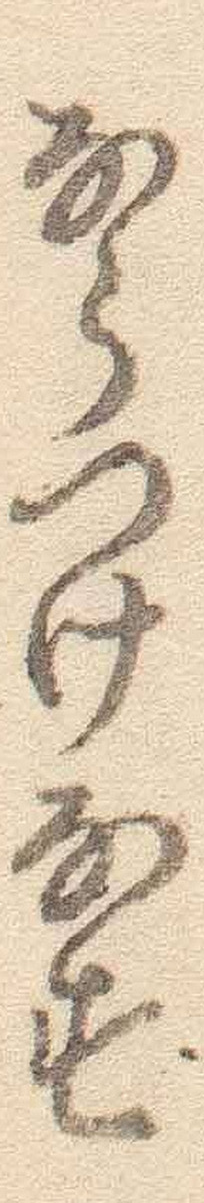みそつけなす
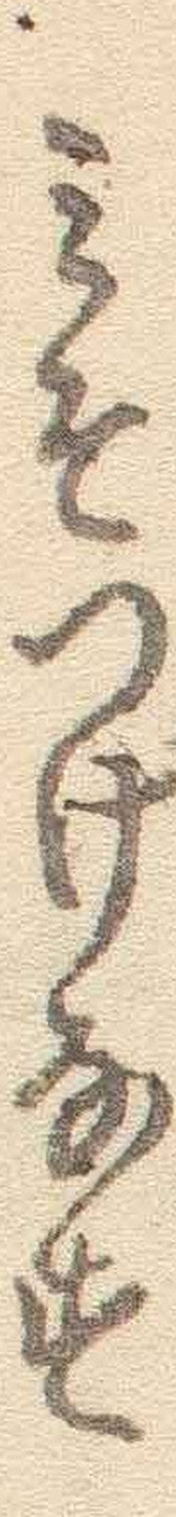みそつけなす
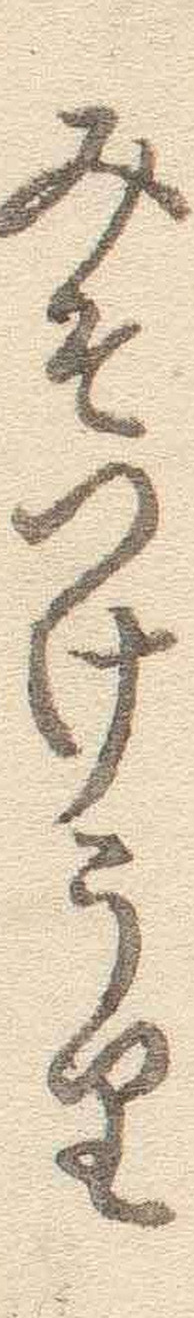みそつけなす
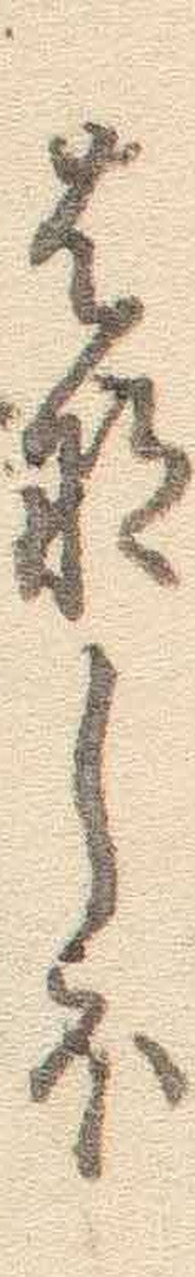はなしほ
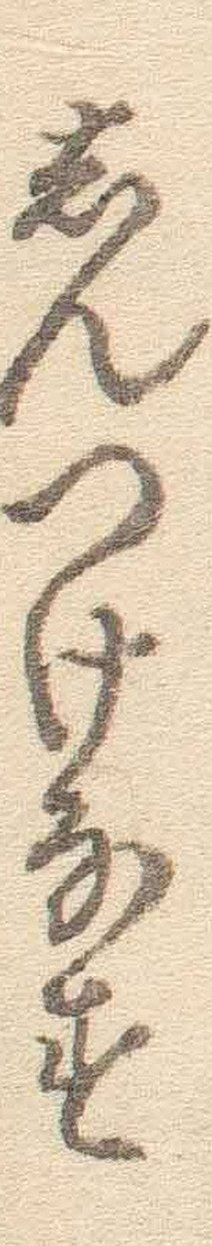みそつけなす

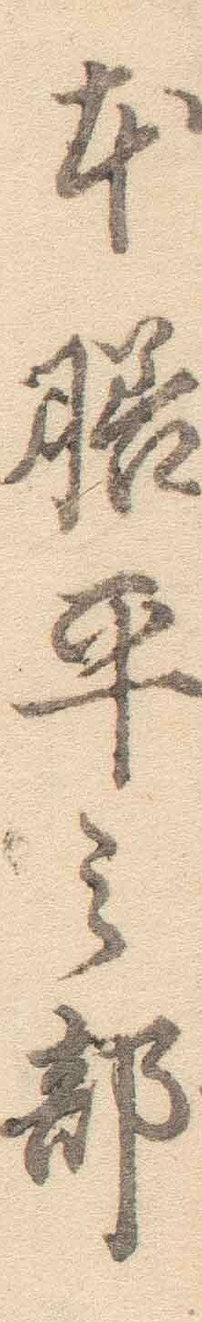本膳平之部
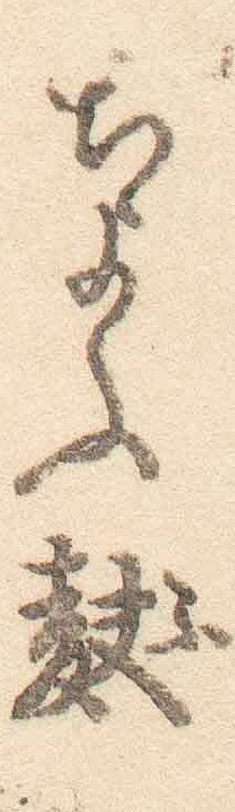ちよふ麩
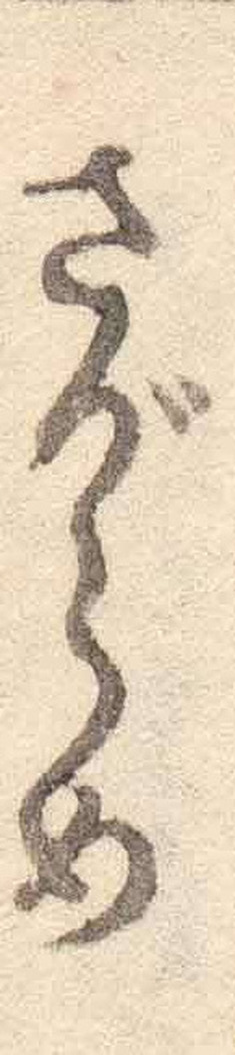さがらめ
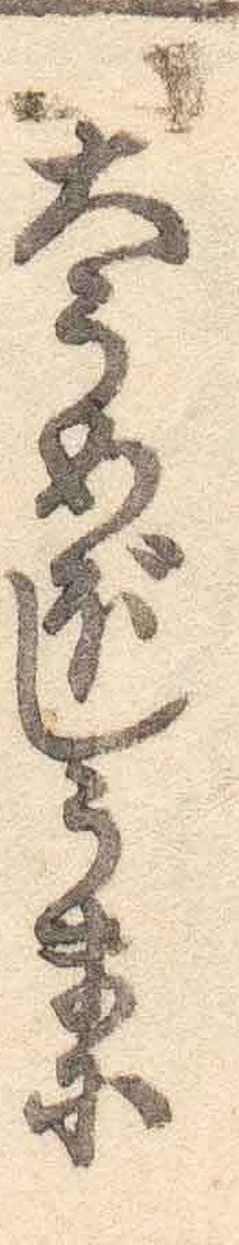大うめぼしうまに
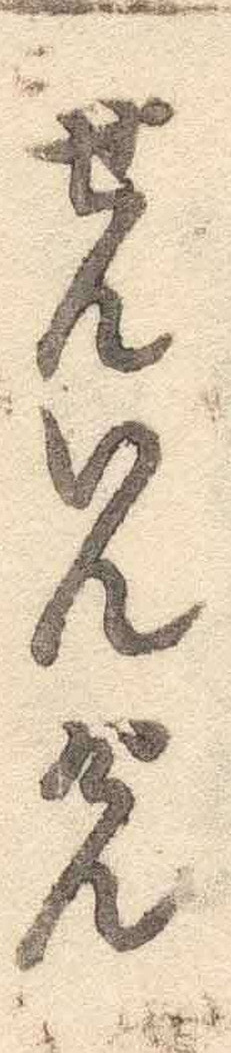せんいんげん
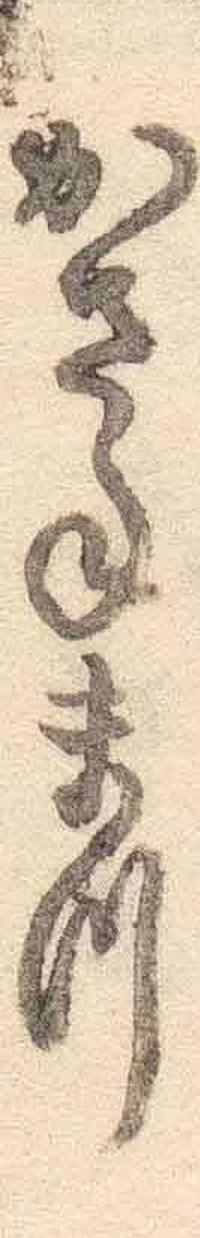かさねまつ
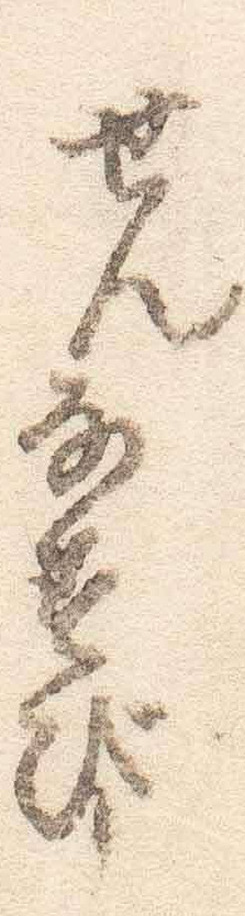せんなすび
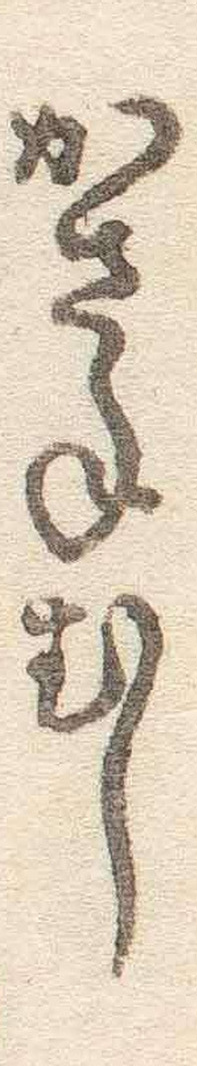かさねまつ
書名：料理通
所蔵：東京学芸大学附属図書館 国文学研究資料館
